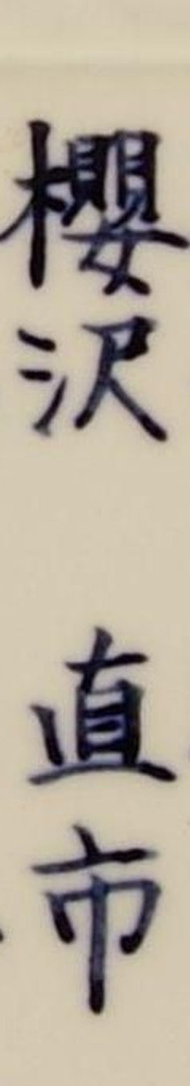桜沢直市
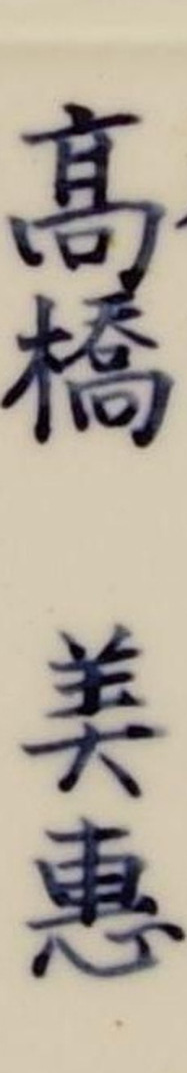高橋美恵
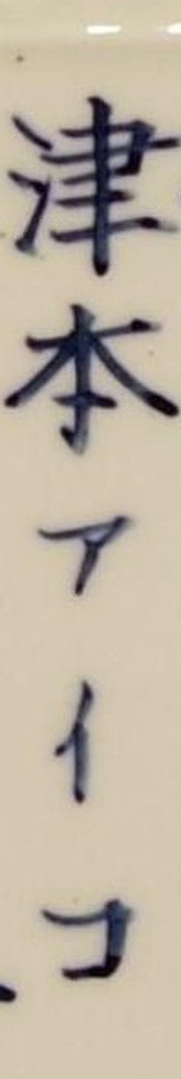津本アイコ
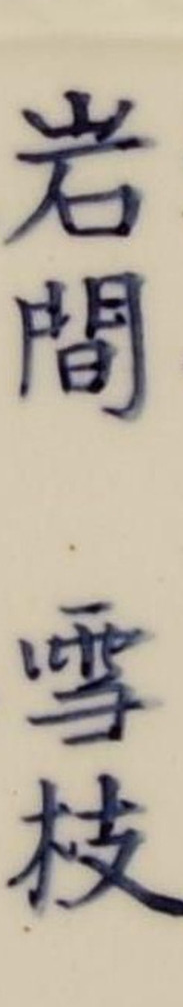岩間雪枝
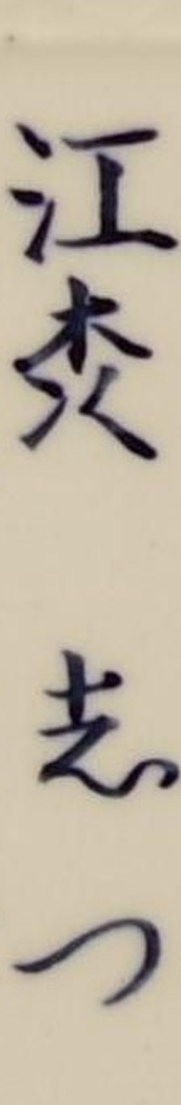江森しつ
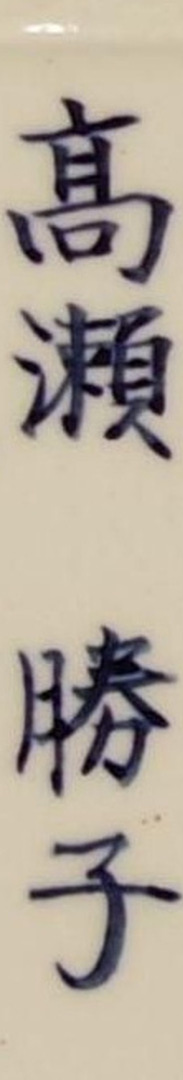高瀬勝子
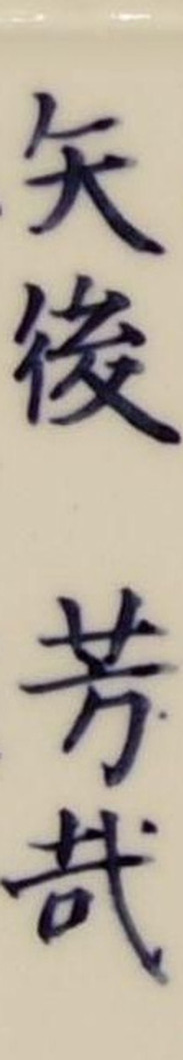矢後芳哉
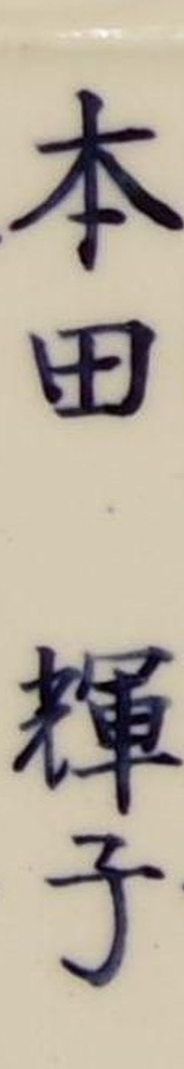本田輝子
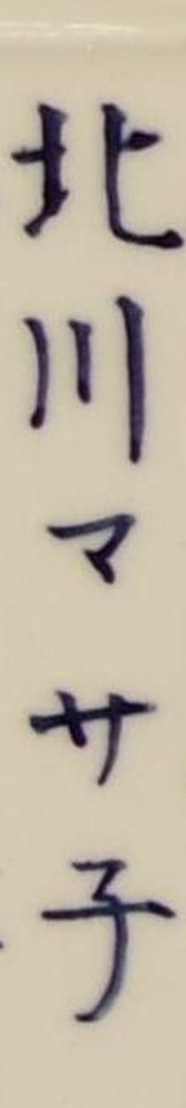北川マサ子
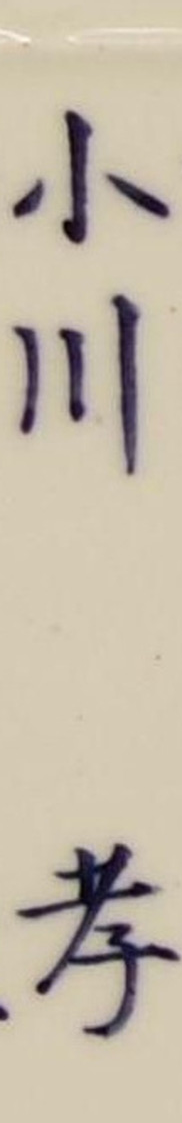小川孝
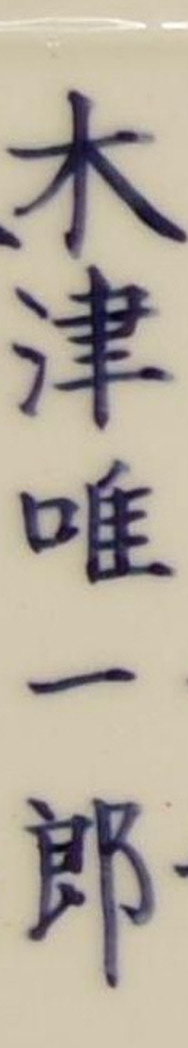木津唯一郎
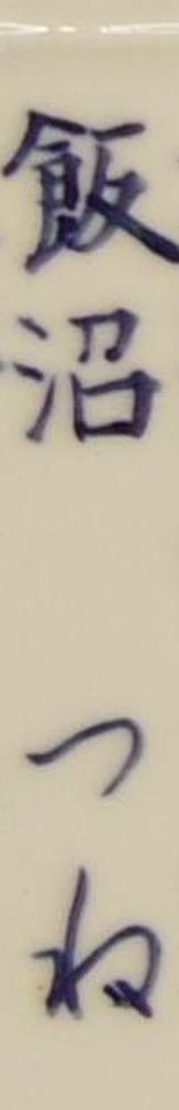飯沼つね
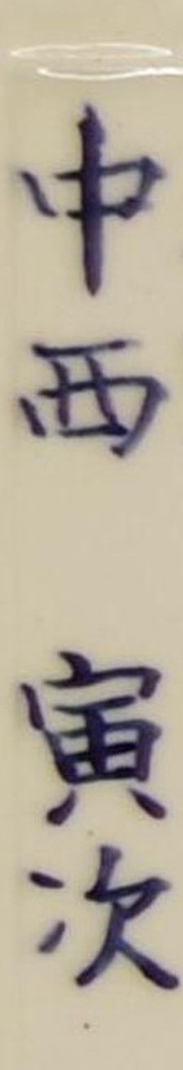中西寅次

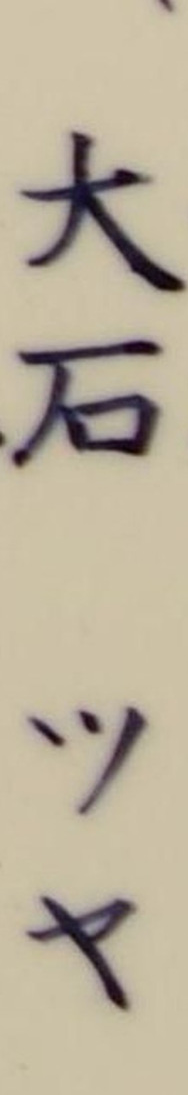大石ツヤ
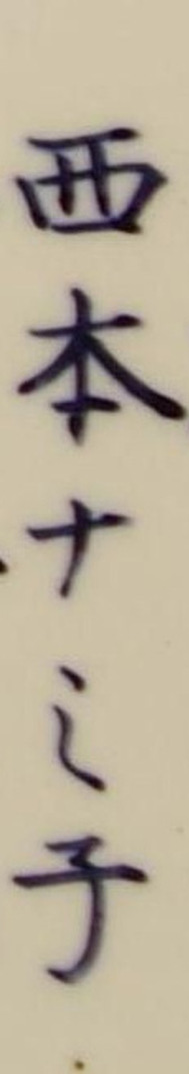西本ナミ子
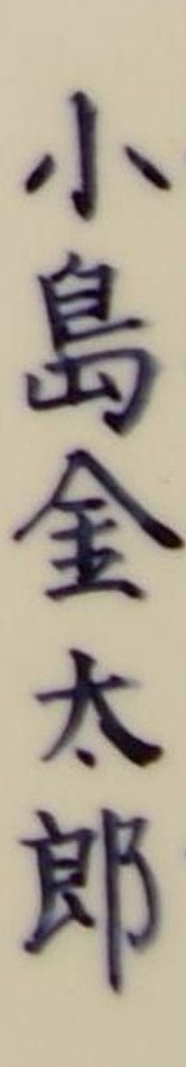小島金太郎
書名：A~D
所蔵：koyasan kongobuji
